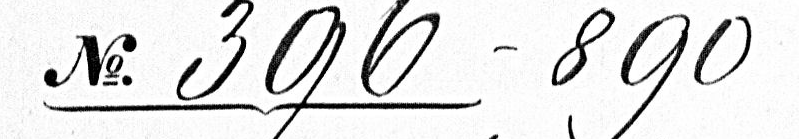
N° 396 - 890
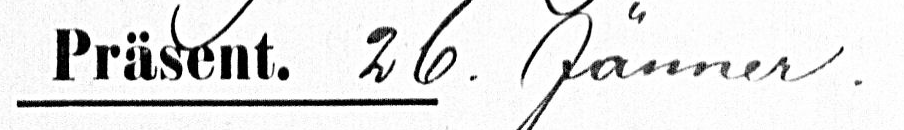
Präsent. 26. Jänner.
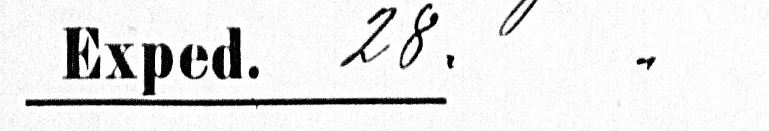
Exped. 28. Jänner.
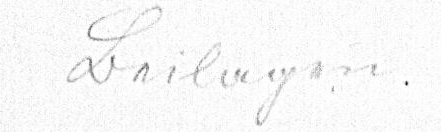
Beilagen.
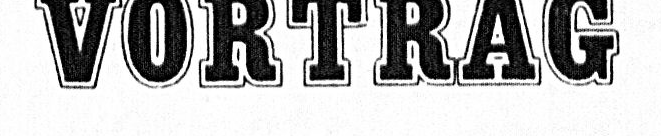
VORTRAG
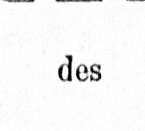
des
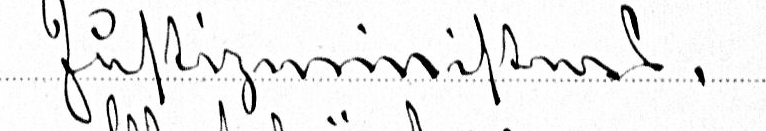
Justizministers.
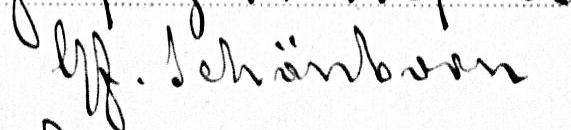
Gf. Schönborn
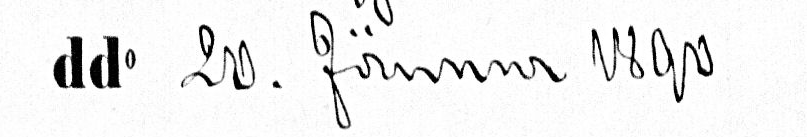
dd° 20. Jänner 1890
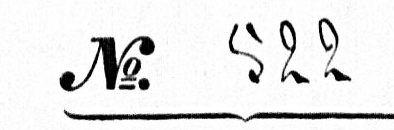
N° 522
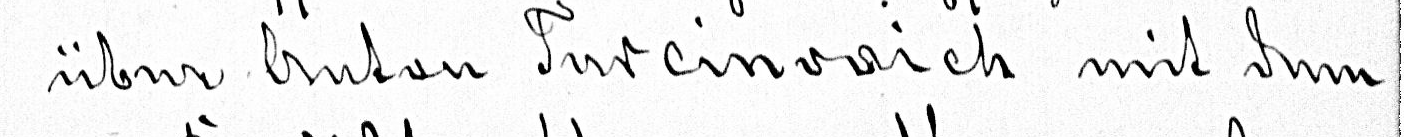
über Anton Turcinovich mit dem
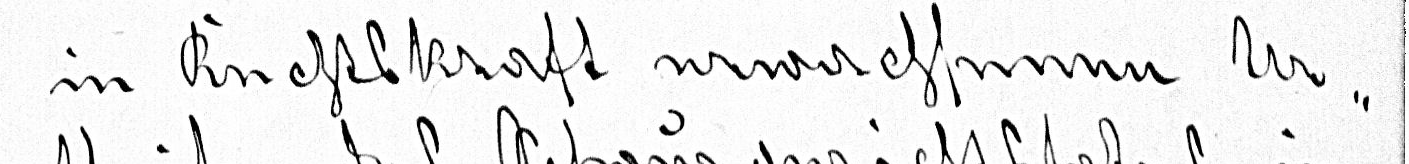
in Rechtskraft erwachsenen Ur¬
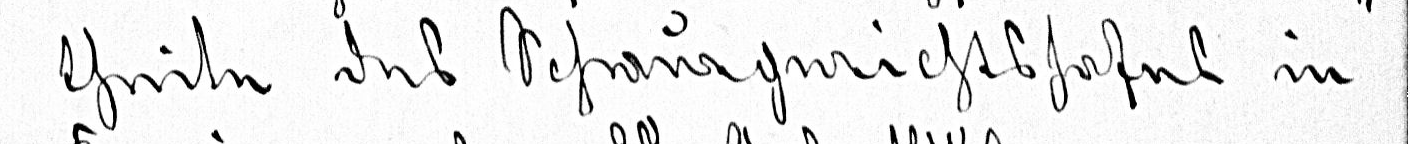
theile des Schwurgerichtshofes in
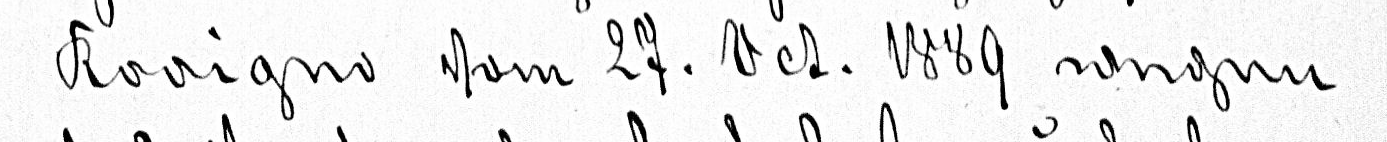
Rovigno vom 27. Oct. 1889 wegen
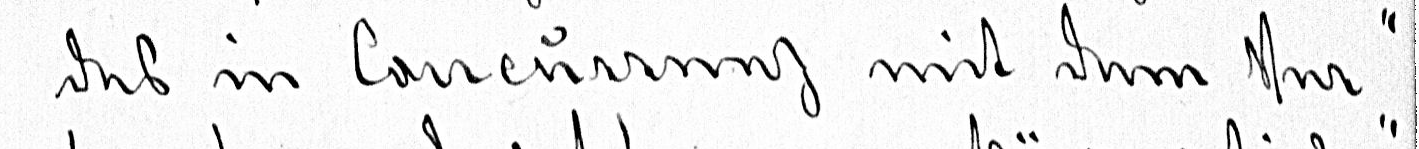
des in Concurrenz mit dem Ver¬
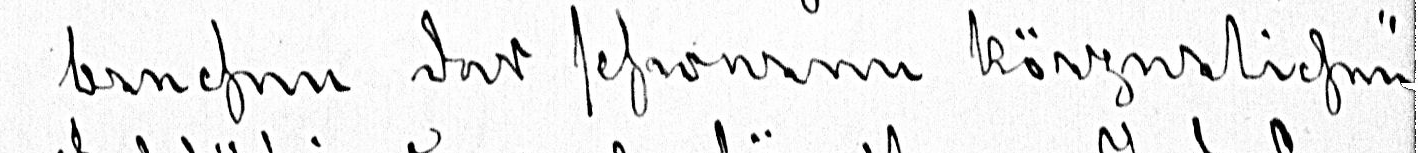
brechen der schweren körperlichen
